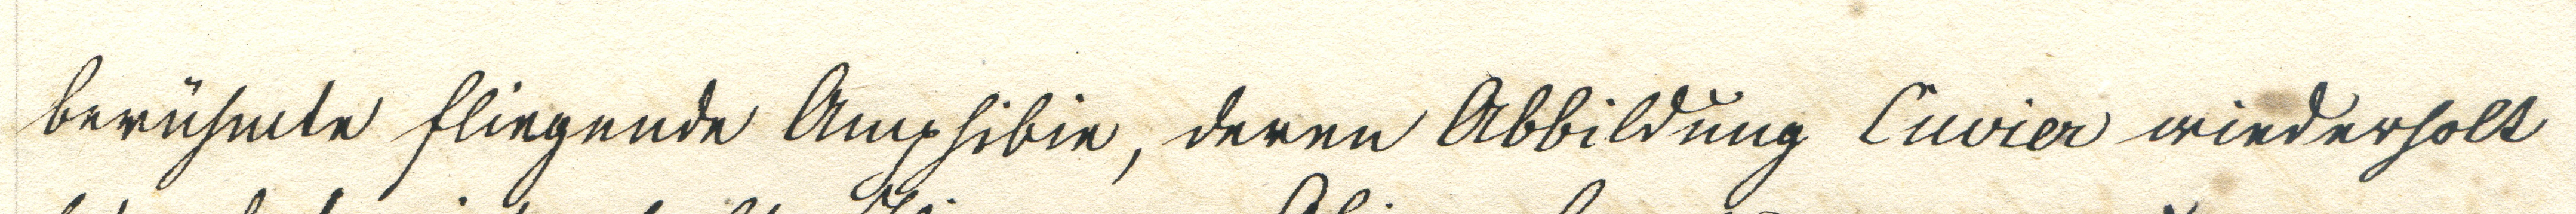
berühmte fliegende Amphibie, deren Abbildung Cuvier wiederholt
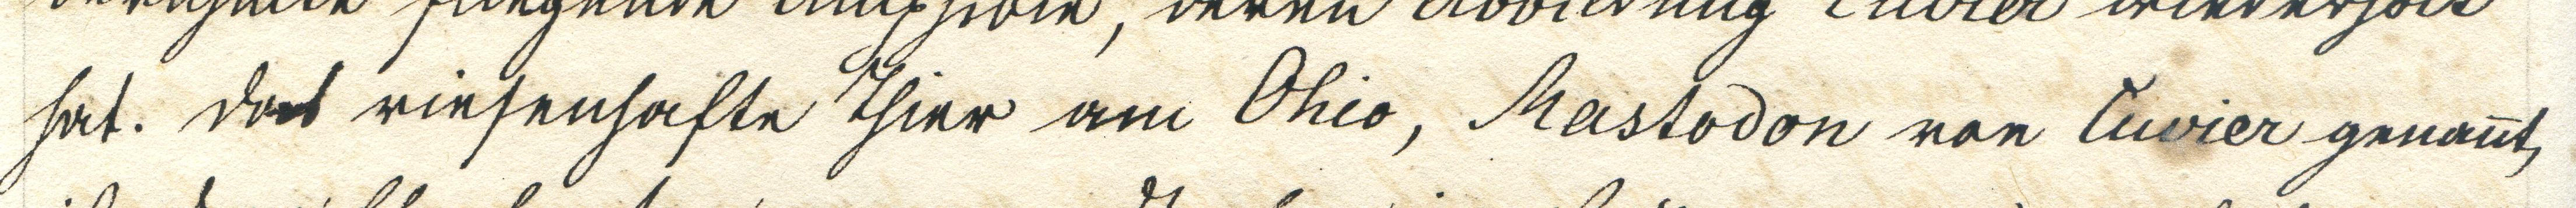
hat. Das riesenhafte Thier am Ohio, Mastodon von Cuvier genañt,
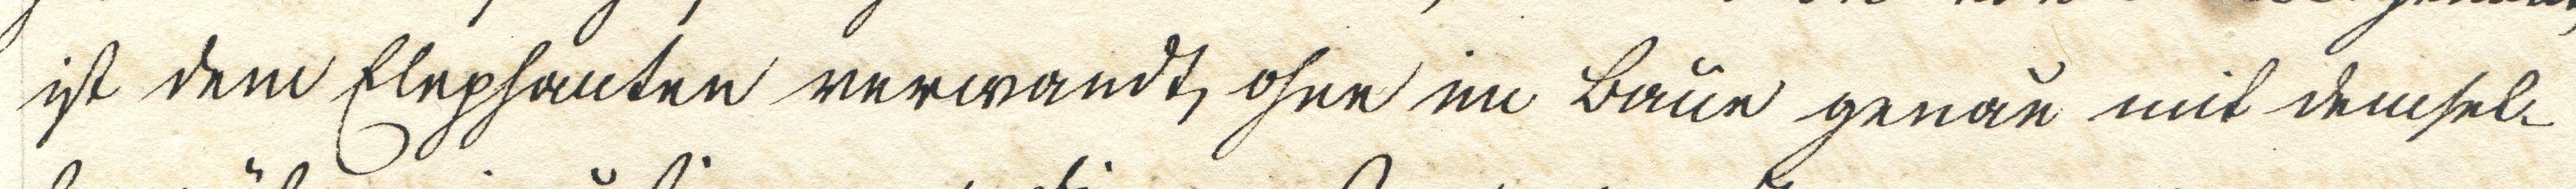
ist dem Elephanten verwandt, ohne im Baue genau mit demsel-
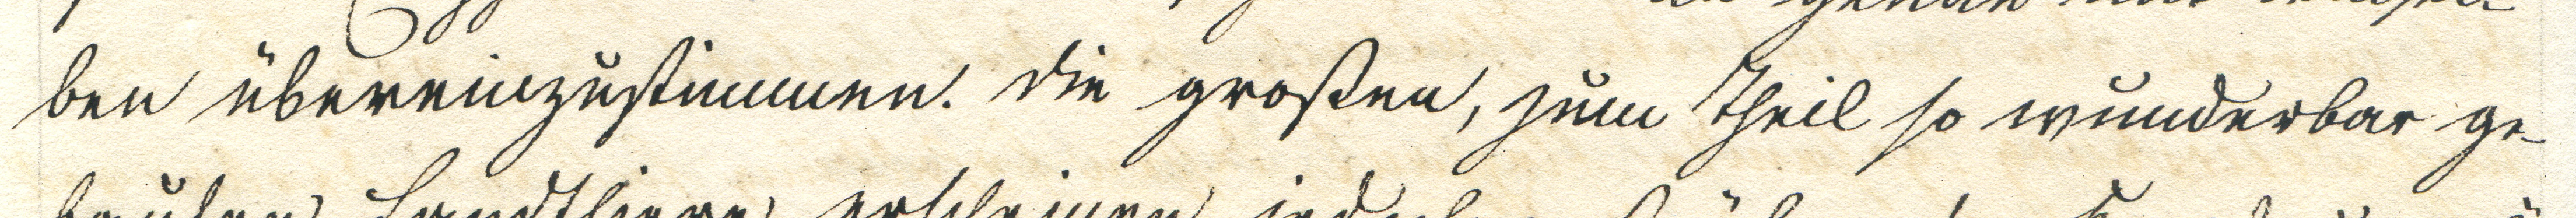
ben übereinzustimmen. Die großen, zum Theil so wunderbar ge-
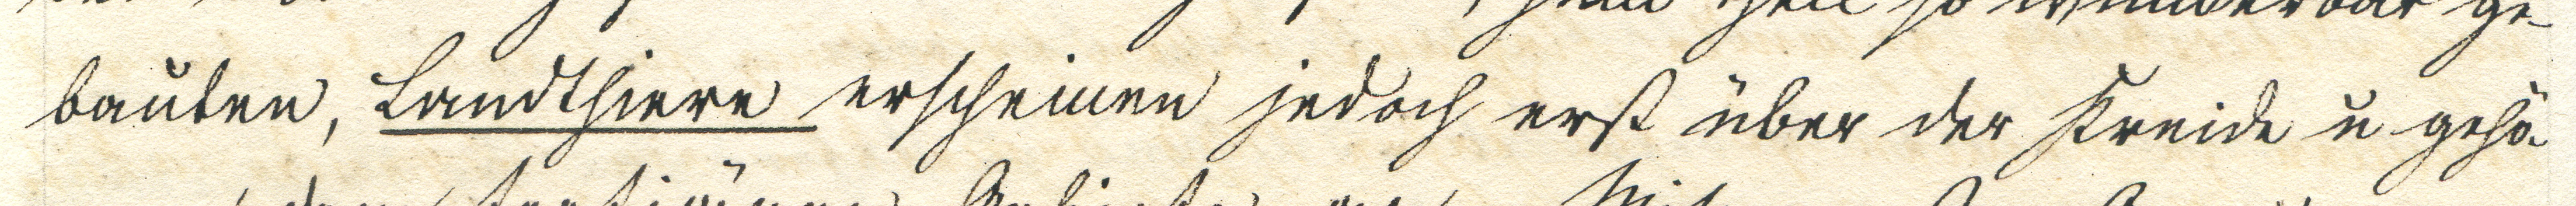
bauten, Landthiere erscheinen jedoch erst über der Kreide u gehö-
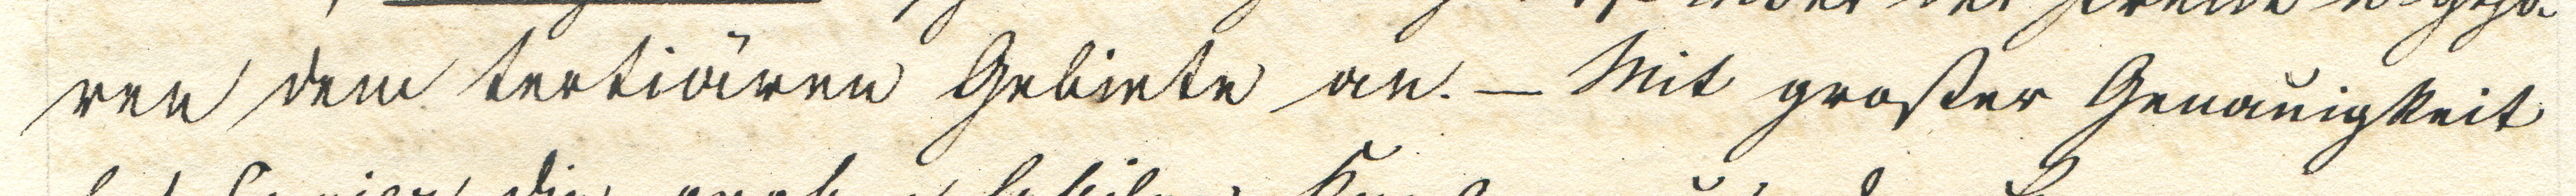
ren dem tertiären Gebiete an. – Mit großer Genauigkeit
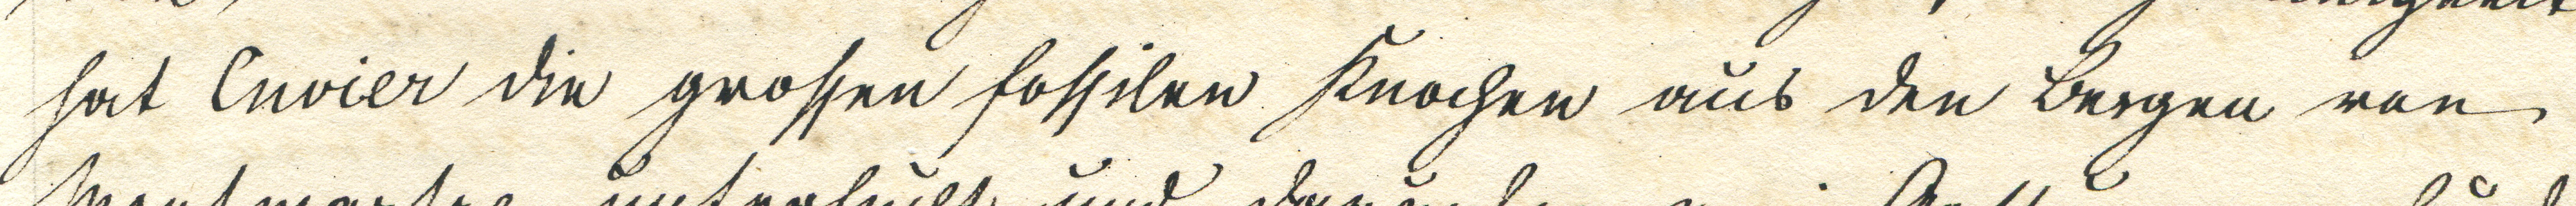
hat Cuvier die grossen fossilen Knochen aus den Bergen von
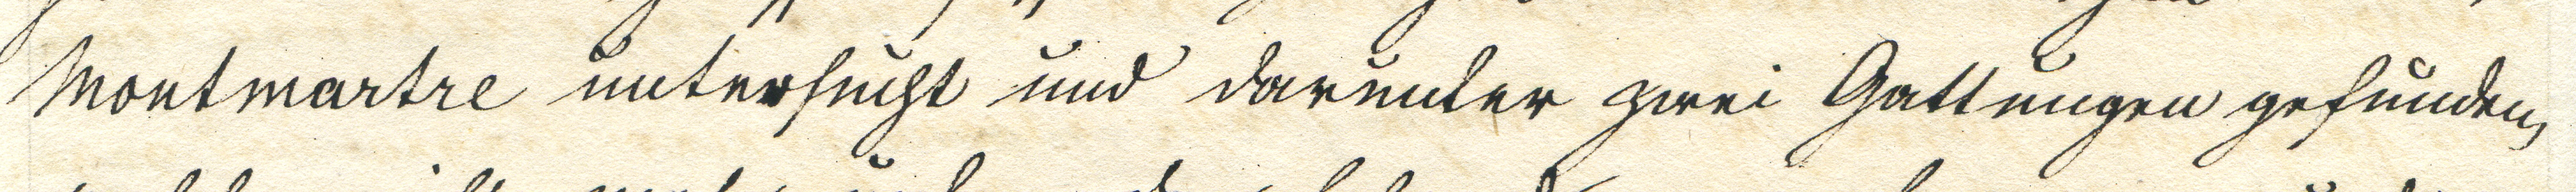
Montmartre untersucht und darunter 2 Gattungen gefunden,
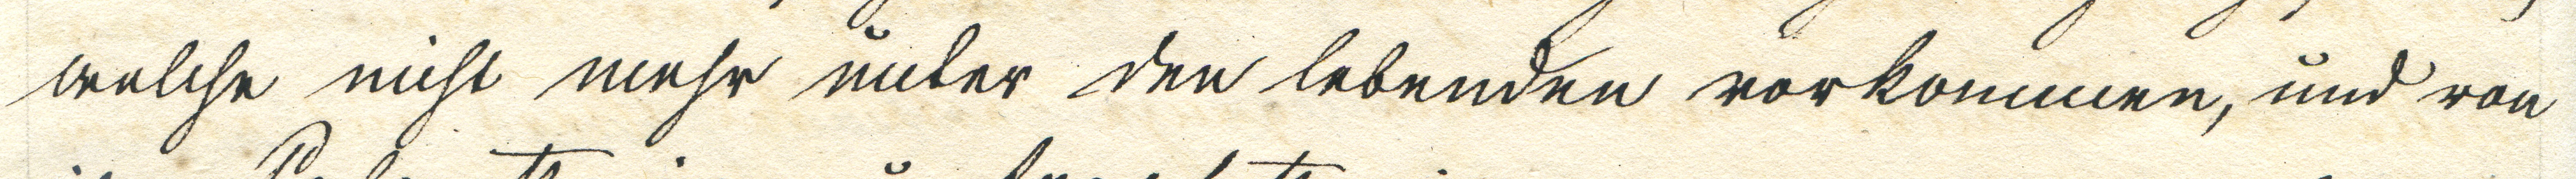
welche nicht mehr unter den lebenden vorkommen, und von
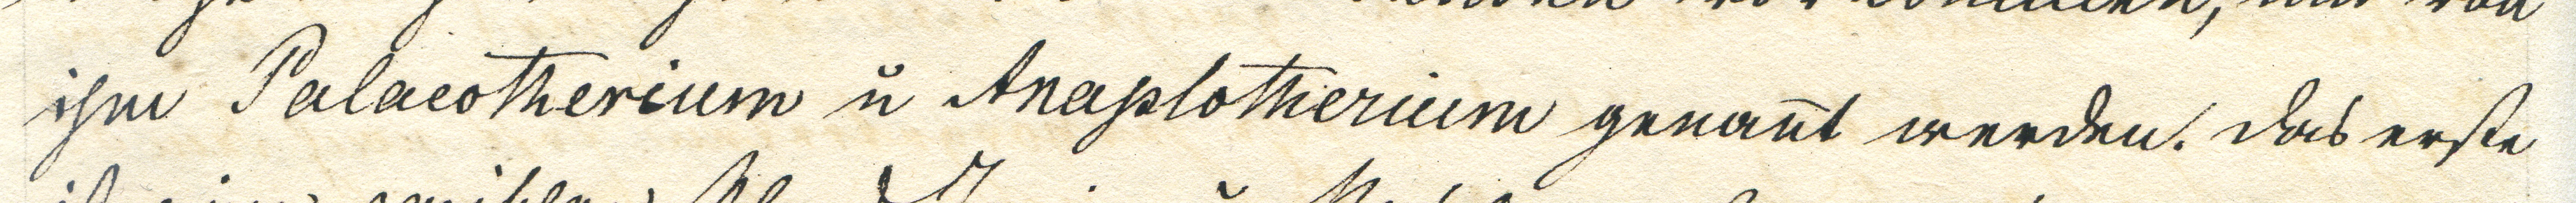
ihm Palaeotherium u Anaplotherium genañt werden. Das erste
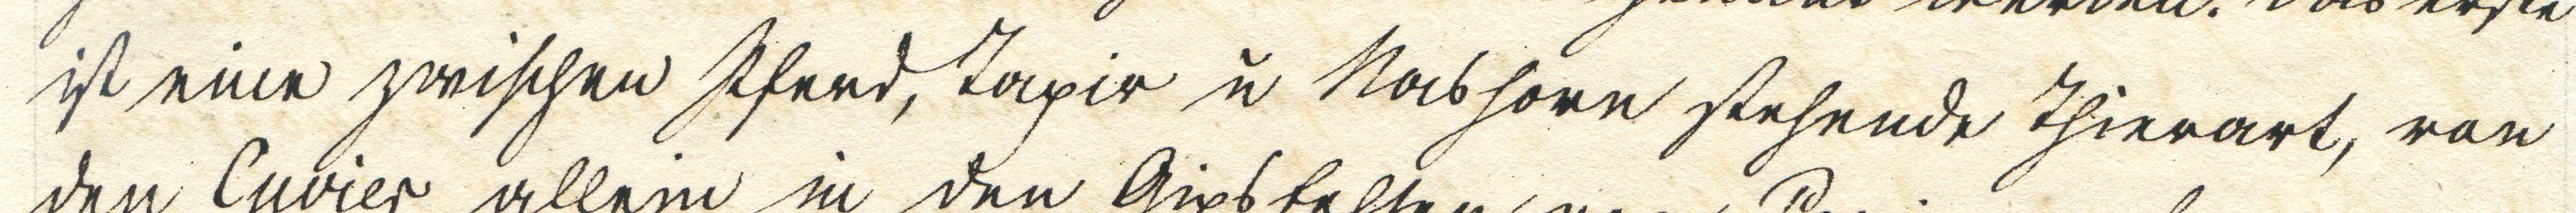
ist eine zwischen Pferd, Tapir u Nashorn stehende Thierart, von
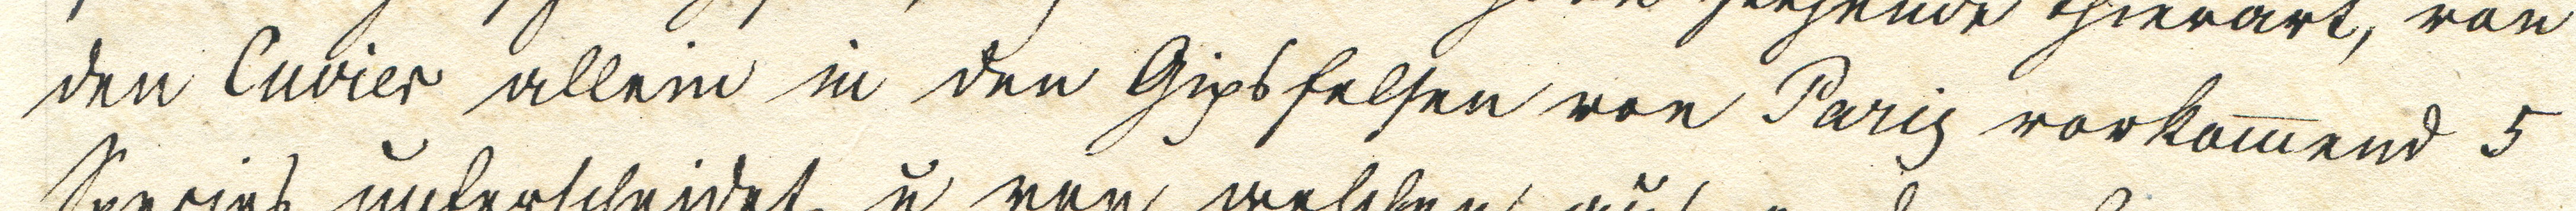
der Cuvier allein in den Gipsfelsen bei Paris vorkom̃end 5
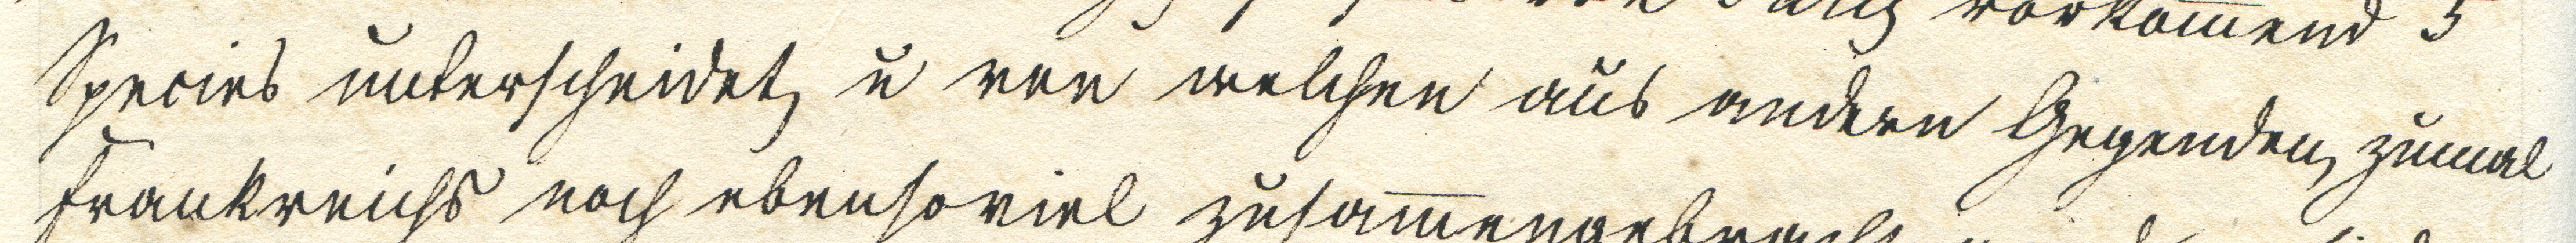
Species unterscheidet, u von welcher aus andern Gegenden, zumal
